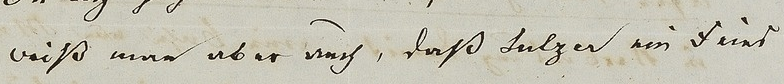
weiß man aber auch, daß Sulzer ein Feind
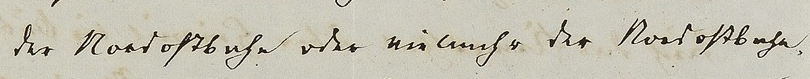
der Nordostbahn oder vielmehr der Nordostbahn–
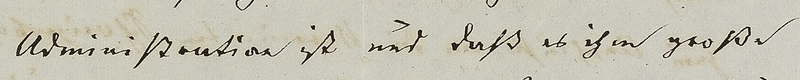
Administration ist und daß es ihm große
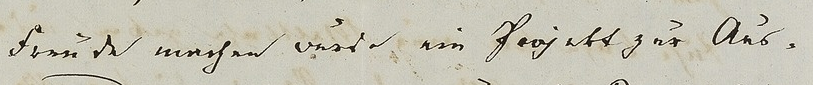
Freude machen würde ein Projekt zur Aus-
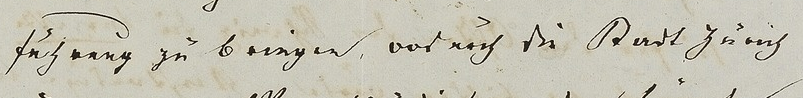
führung zu bringen, wodurch die Stadt Zürich
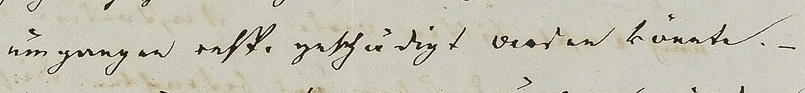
umgangen resp. geschädigt werden könnte. –
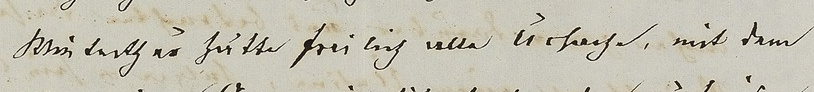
Winterthur hätte freilich alle Ursache, mit dem
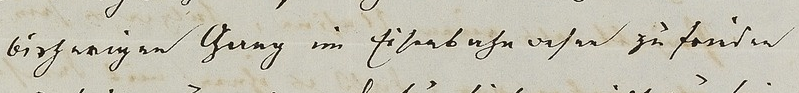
bisherigen Gang im Eisenbahnwesen zufrieden
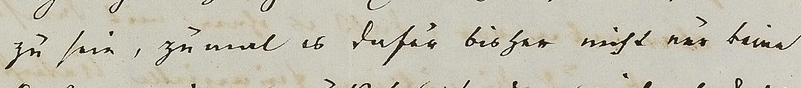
zu sein, zumal es dafür bisher nicht nur keine
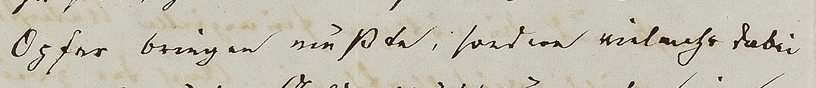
Opfer bringen mußte, sondern vielmehr dabei
